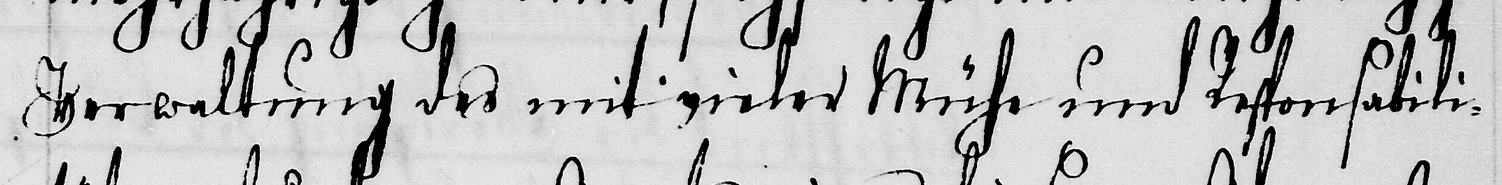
Verwaltung des mit vieler Mühe und Responsabili¬
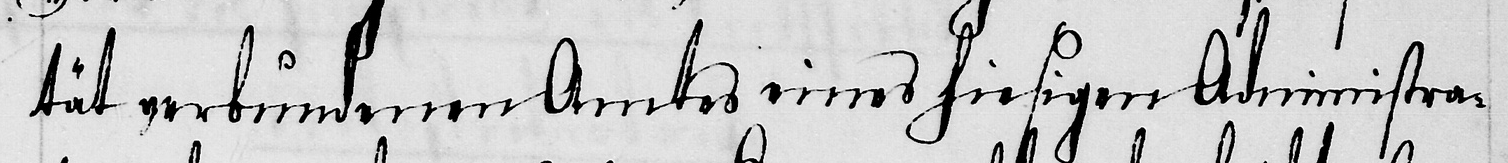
tät verbundenen Amtes eines hiesigen Administra¬
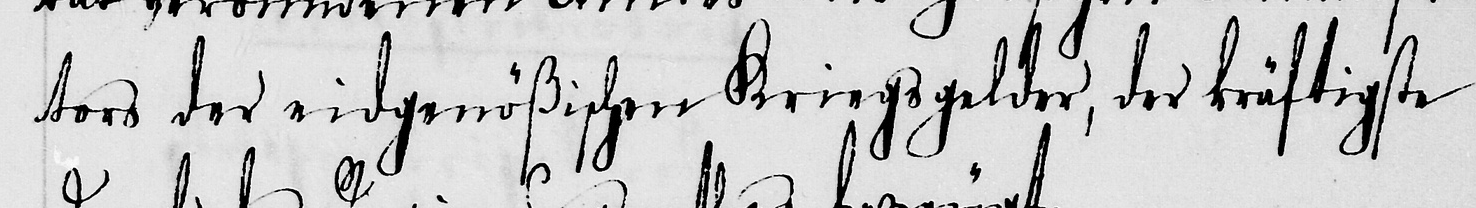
tors der eidgenößischen Kriegsgelder, der kräftigste
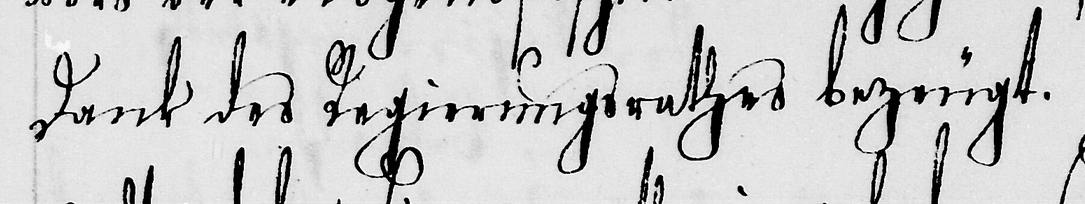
Dank des Regierungsrathes bezeugt.
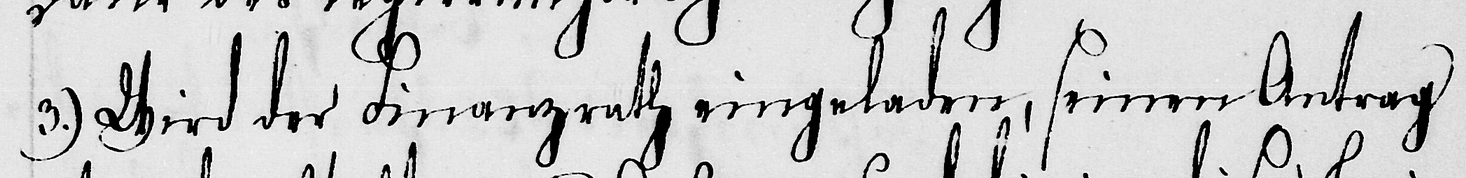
3.) Wird der Finanzrath eingeladen, seinen Antrag
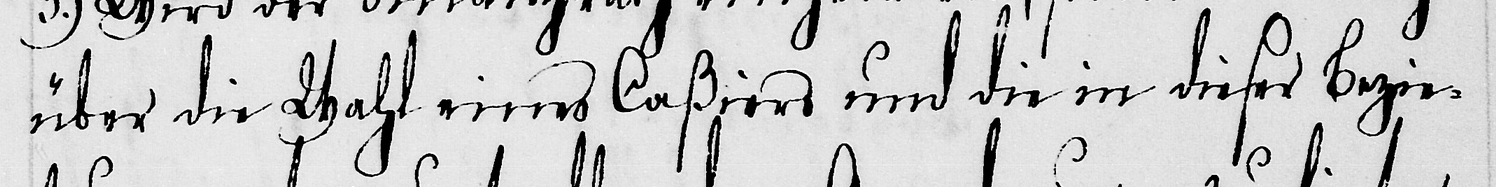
über die Wahl eines Caßiers und die in dieser Bezie¬
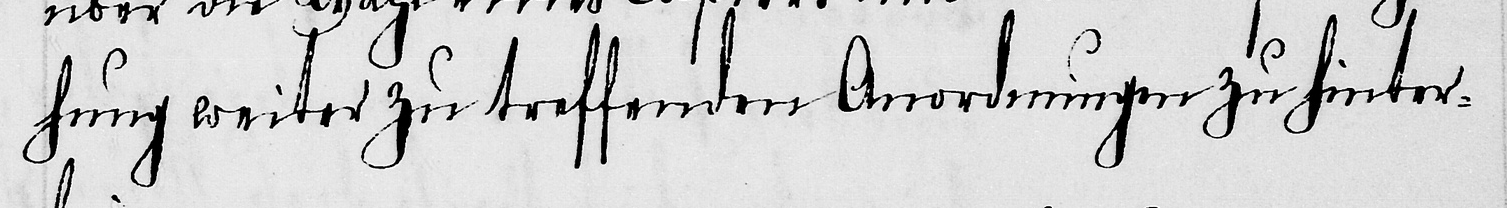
hung weiter zu treffenden Anordnungen zu hinter¬
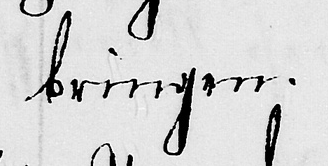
bringen.
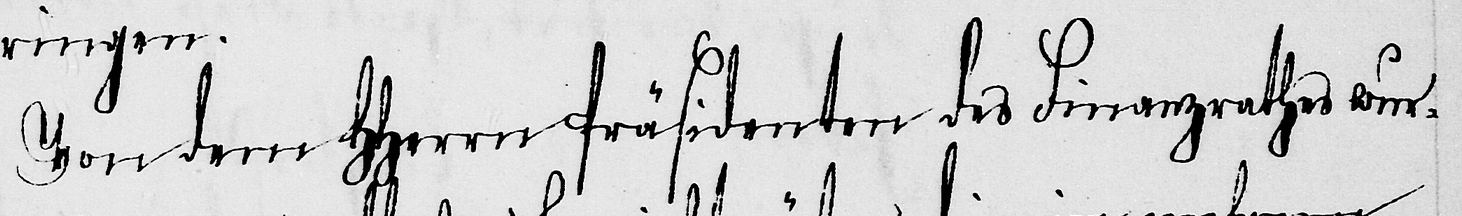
Von dem HHerrn Präsidenten des Finanzrathes wur¬
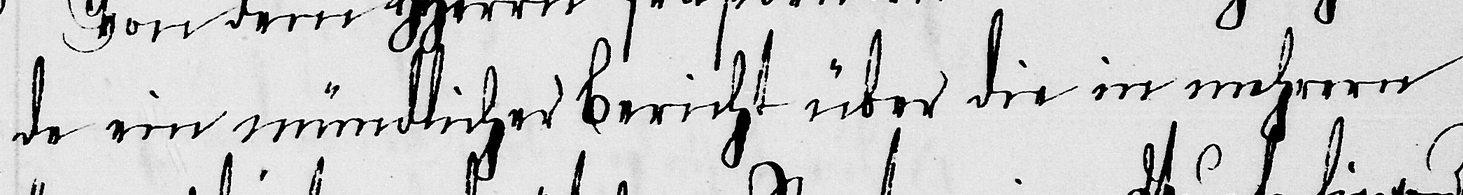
de ein mündlicher Bericht über die in mehrern
